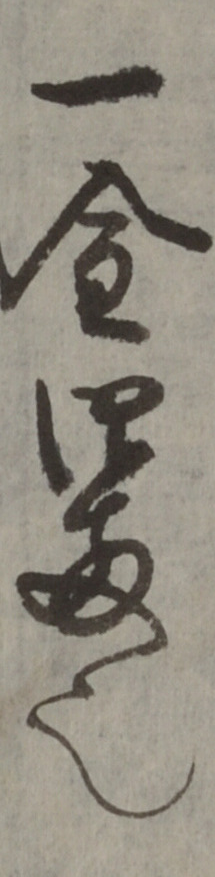一金四両也
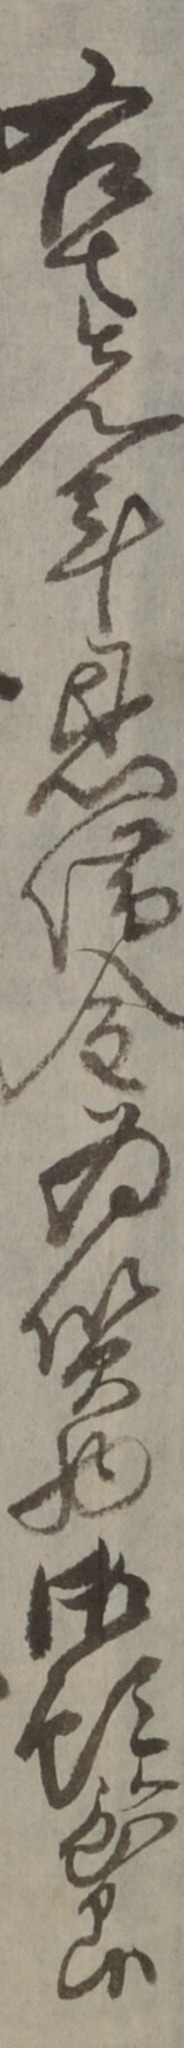右は先年恩借金為質物御預ヶ置申候
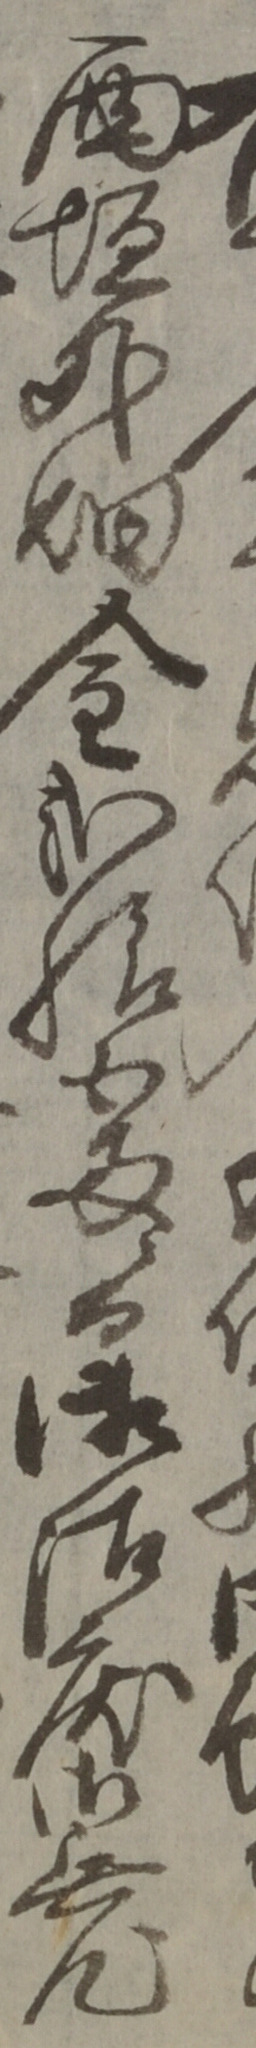西垣外畑金弐拾五両ニ而御請戻御無心
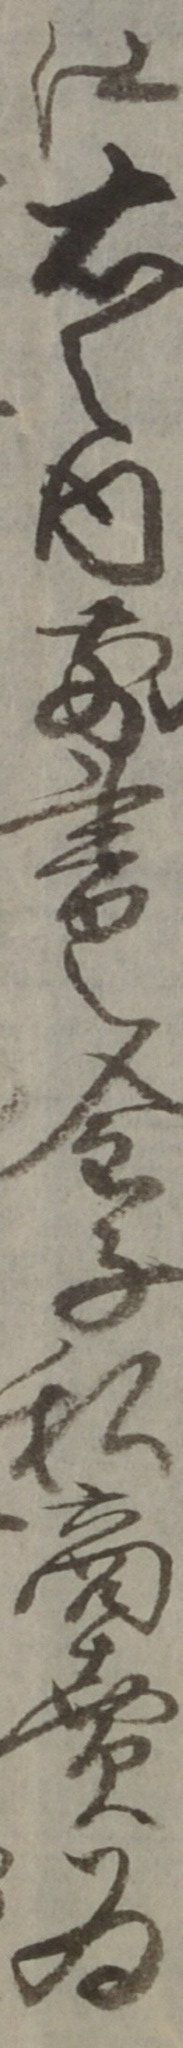仕右之内前書之金子私商売為
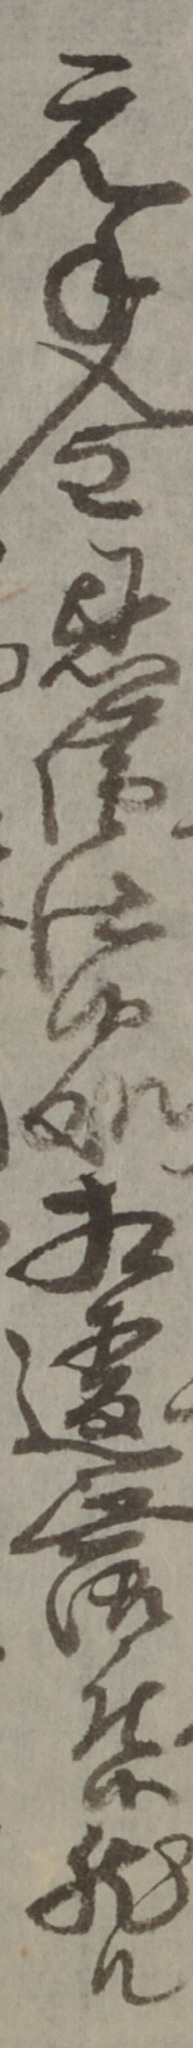元手金恩借仕候処相違無御座候然ル
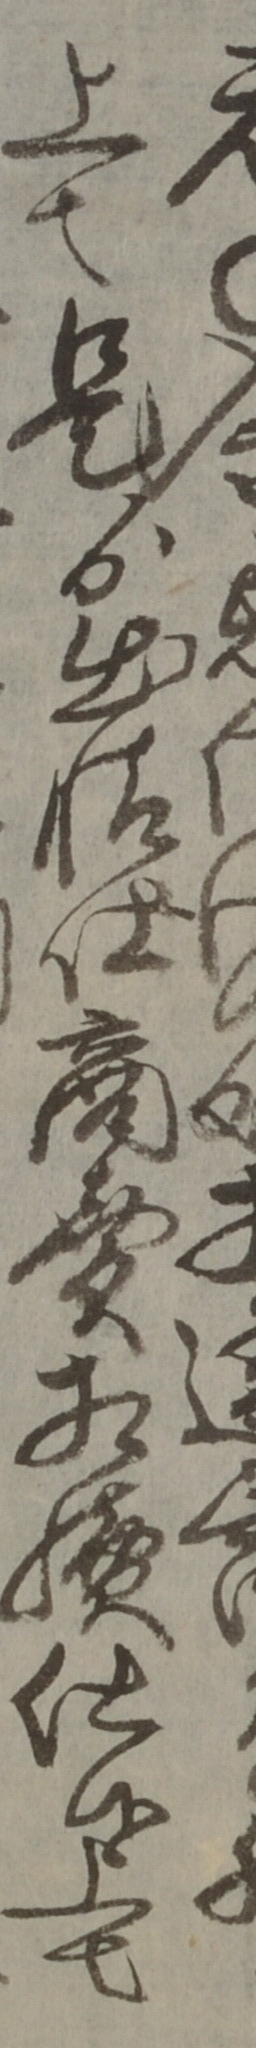上は是ゟ出情仕商売相続仕候上は
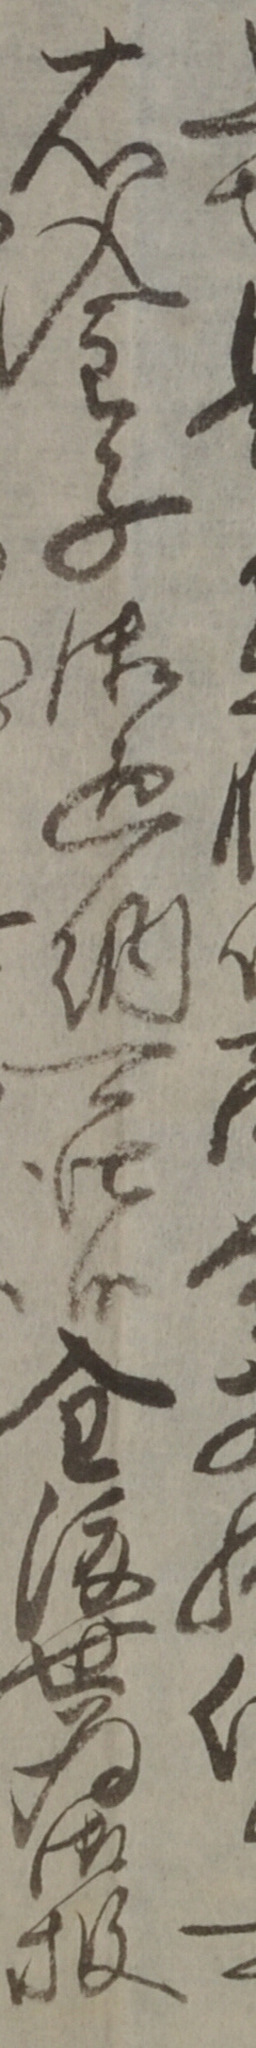右金子御返納可仕候金渡世為御扱
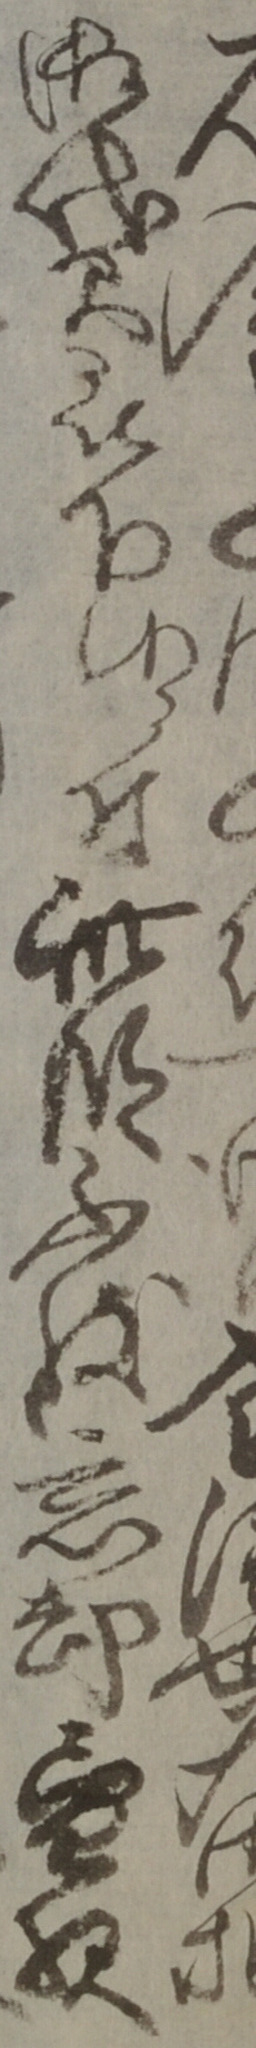御貸被下候ニ付此段不致忘却昼夜
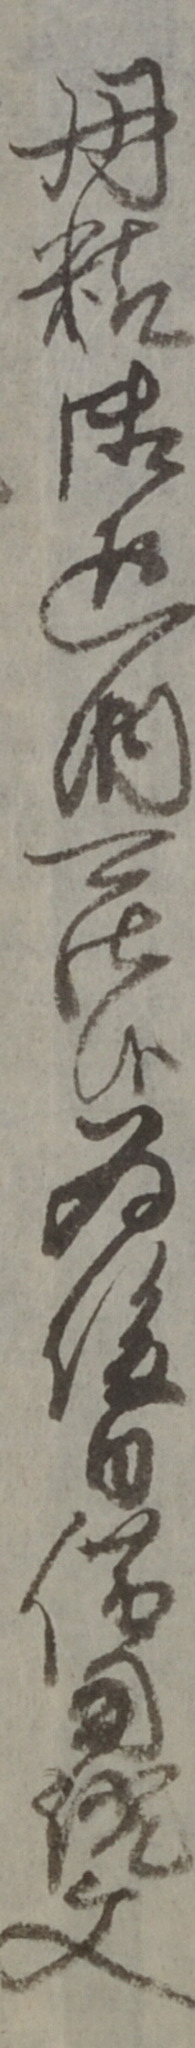丹精御返納可仕候為後日借用証文
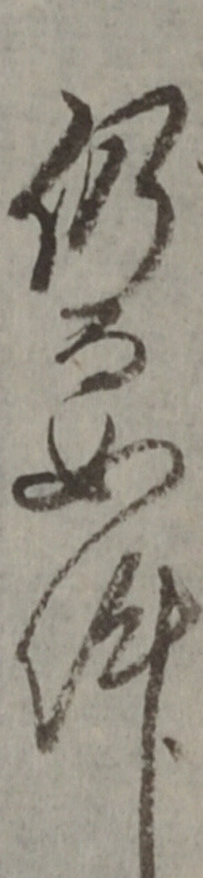仍而如件
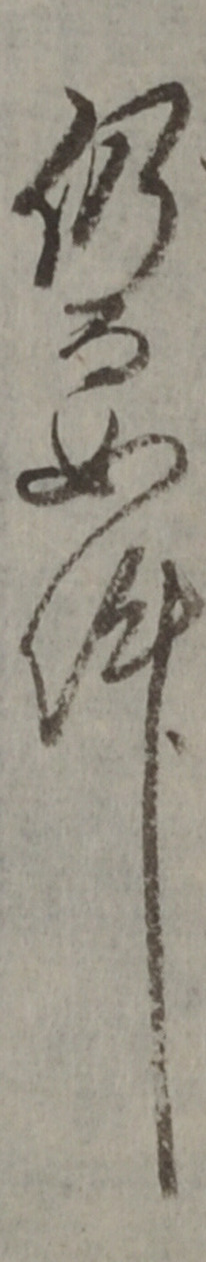仍而如件
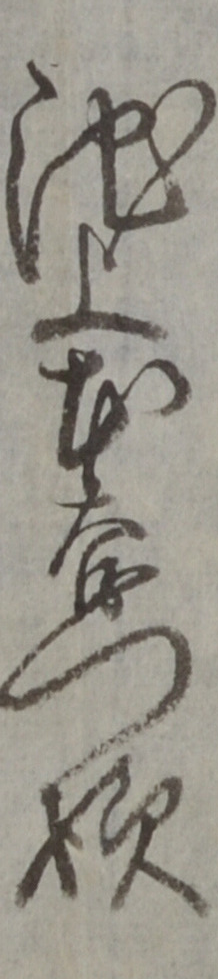池上本右衛門様
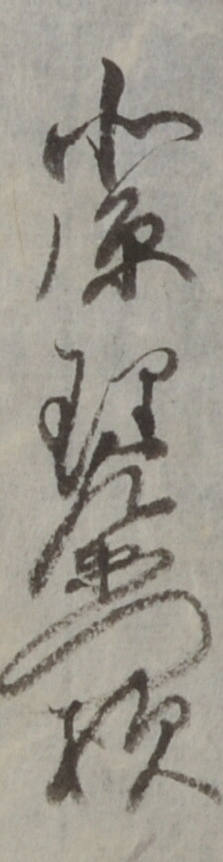北原理左衛門様

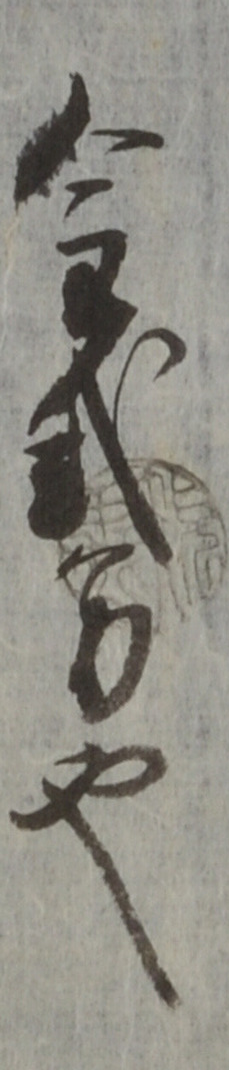金弐分也
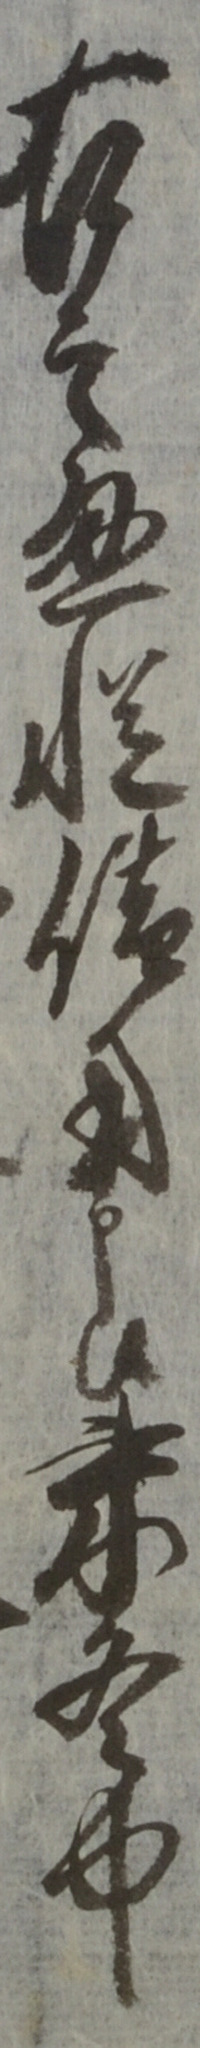右之通慥借用申候来冬中
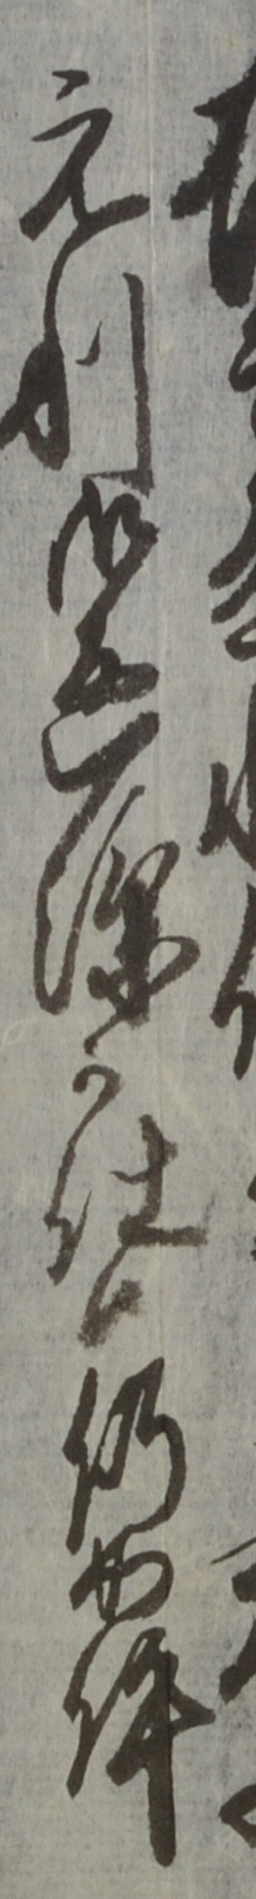元利御返済可仕候仍而件
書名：覚
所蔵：伊那市立高遠町図書館・合同会社AMANE
